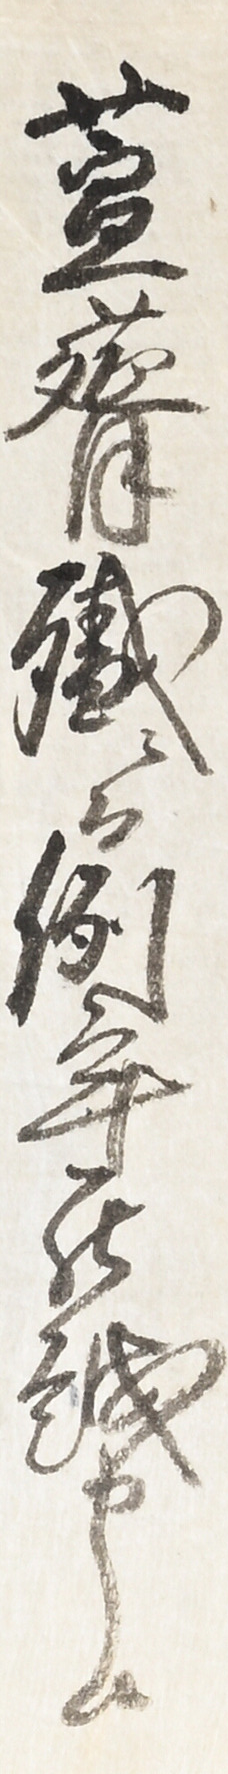萱葺職ニ而例年罷越申候
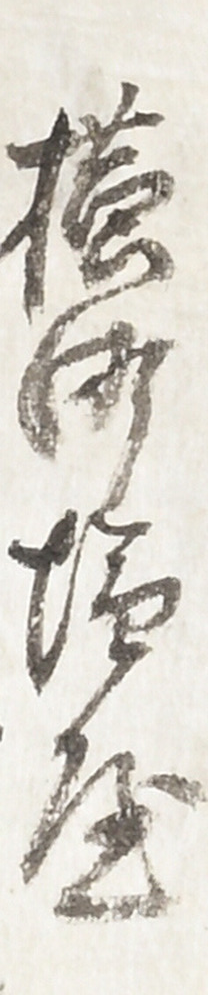横町塩屋
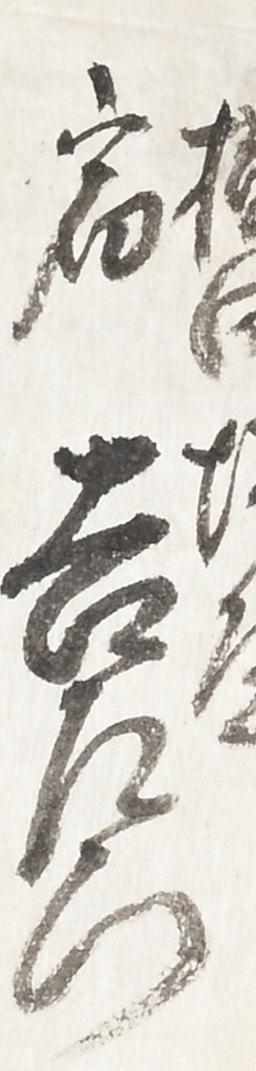宿吉左衛門
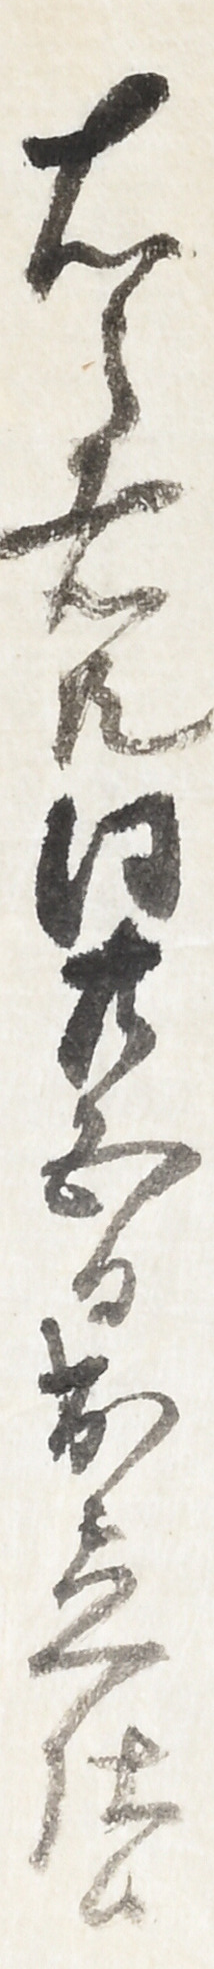右之者共同廿五日出立仕候
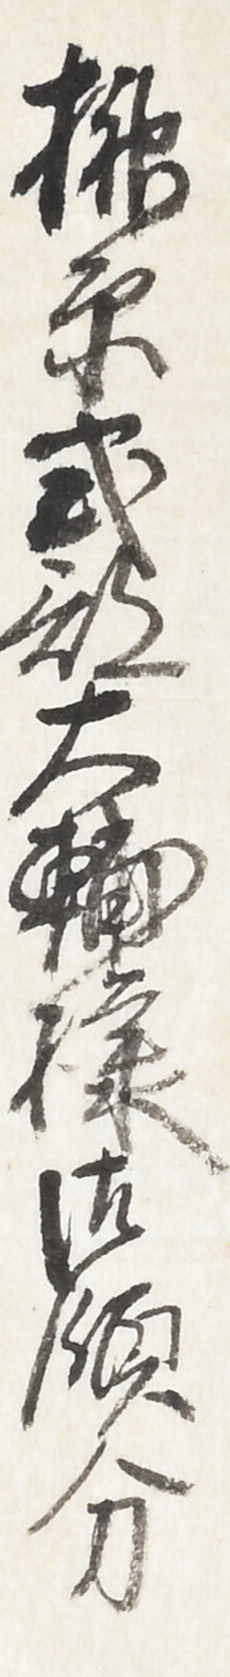榊原式部大輔様御領分
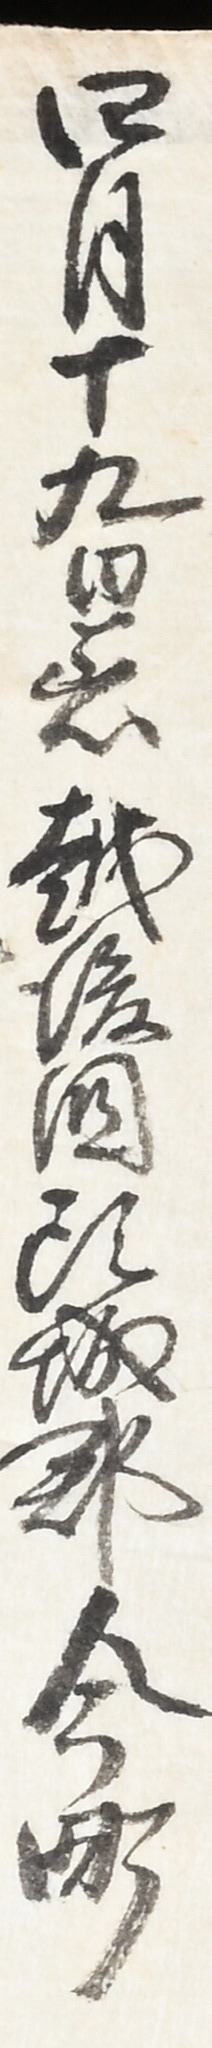四月十九日着越後国頸城郡今町
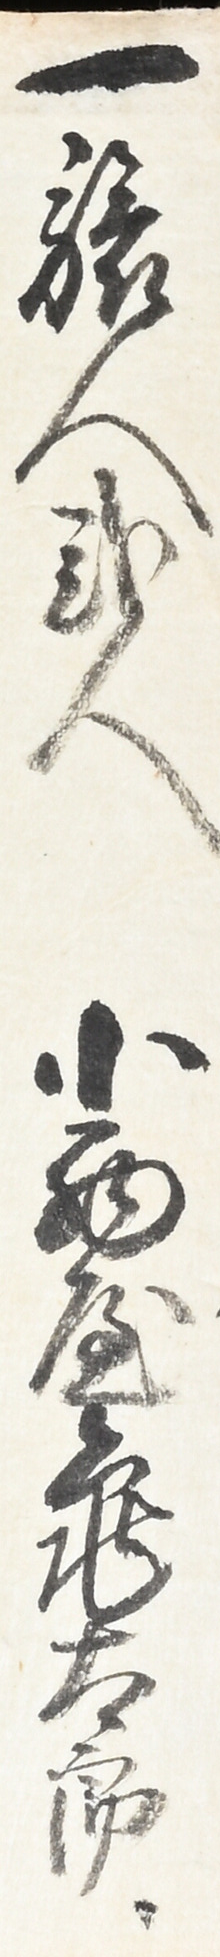一旅人弐人小西屋亀太郎
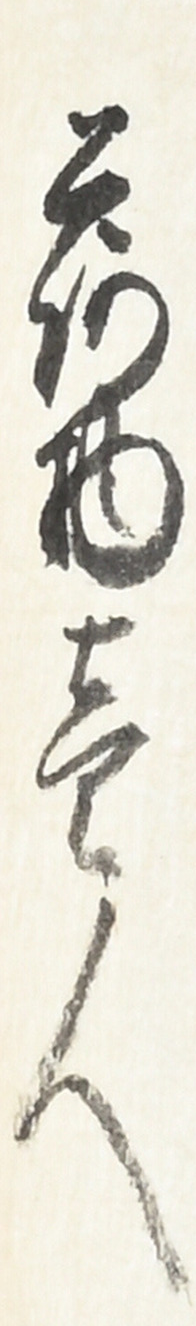荷物壱人
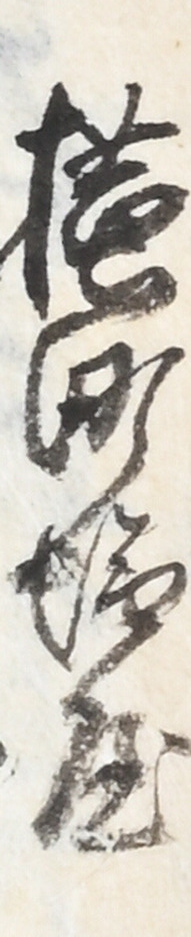横町塩屋
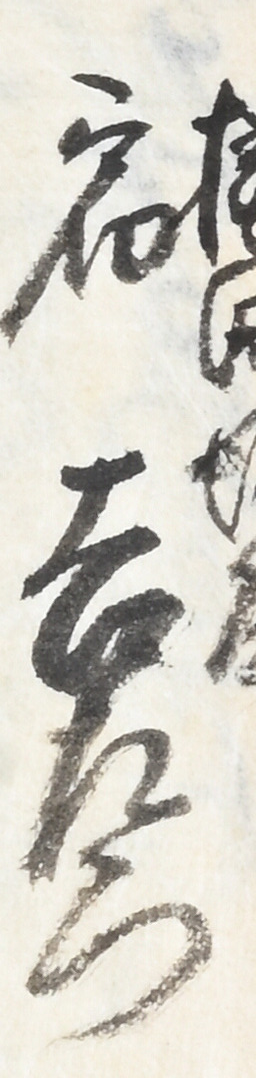宿吉左衛門
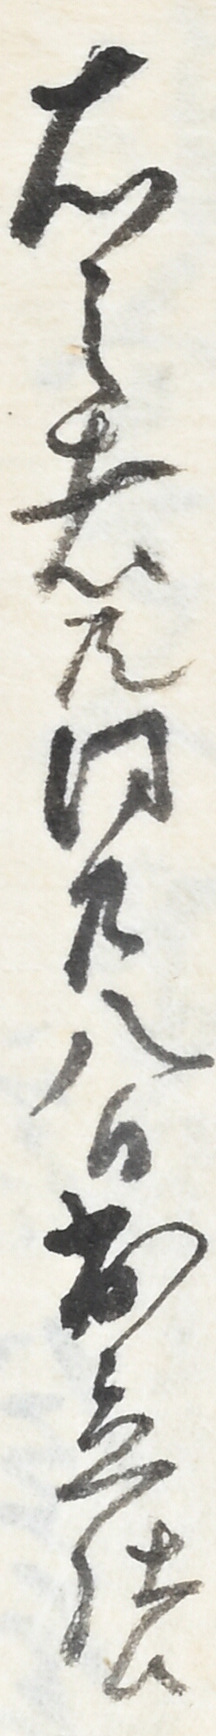右之者共同廿五日出立仕候

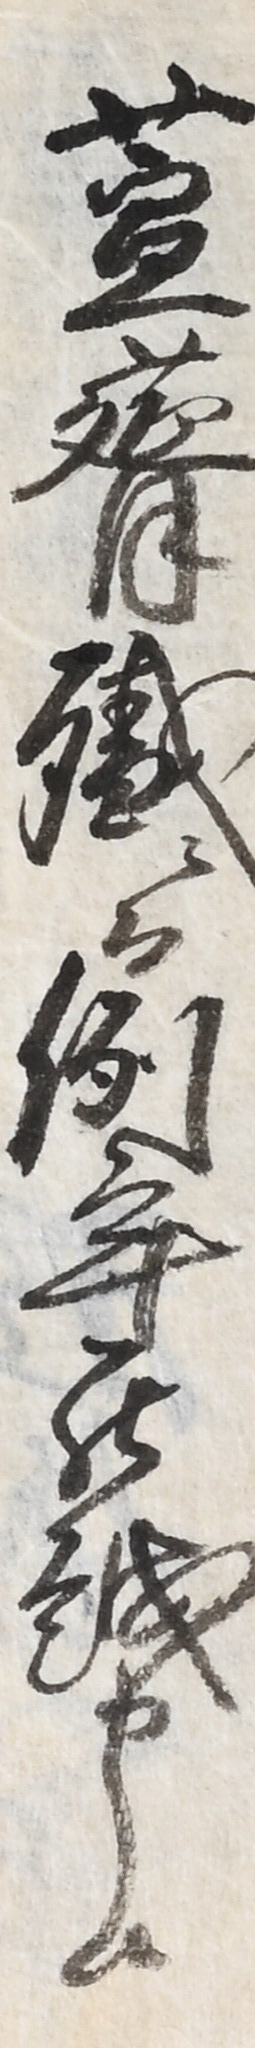油商売ニ而例年罷越申候
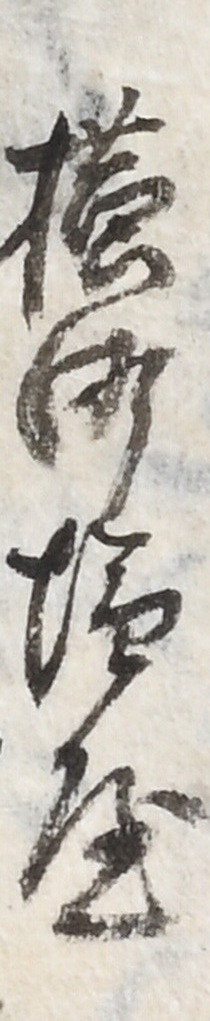横町塩屋
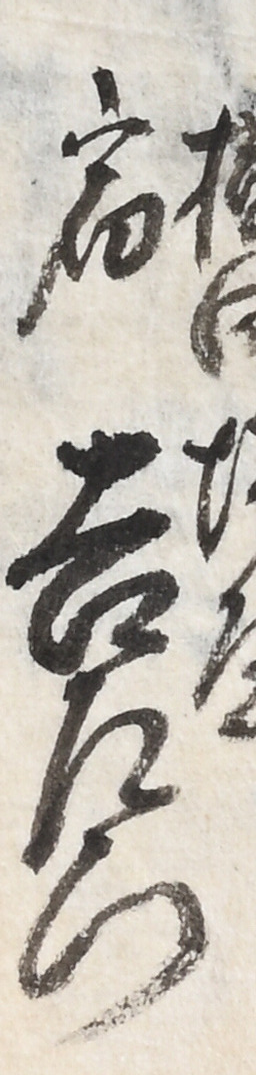宿吉左衛門
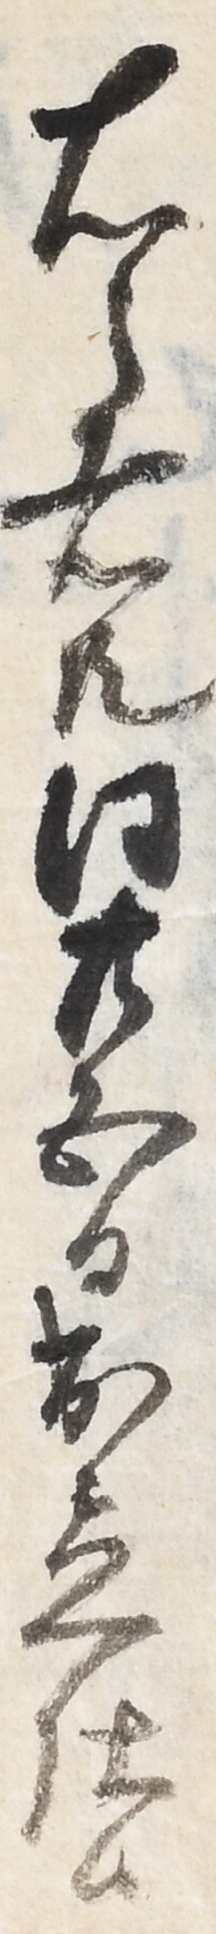右之者共同廿八日出立仕候
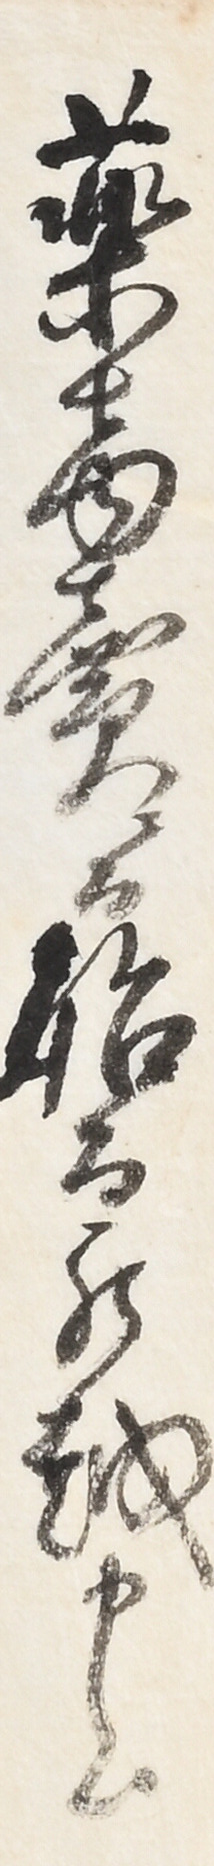薬商売ニ而始而罷越申候
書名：旅人泊控帳
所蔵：伊那市立高遠町図書館・合同会社AMANE
